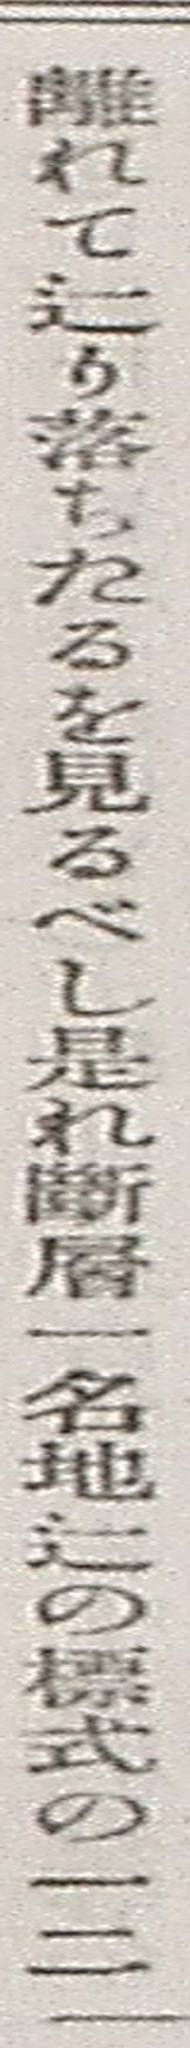離れて辷り落ちたるを見るべし是れ断層一各地辷の標式の一二
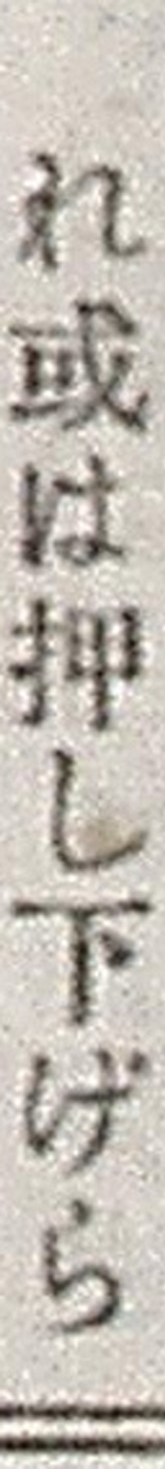れ或は押し下げら
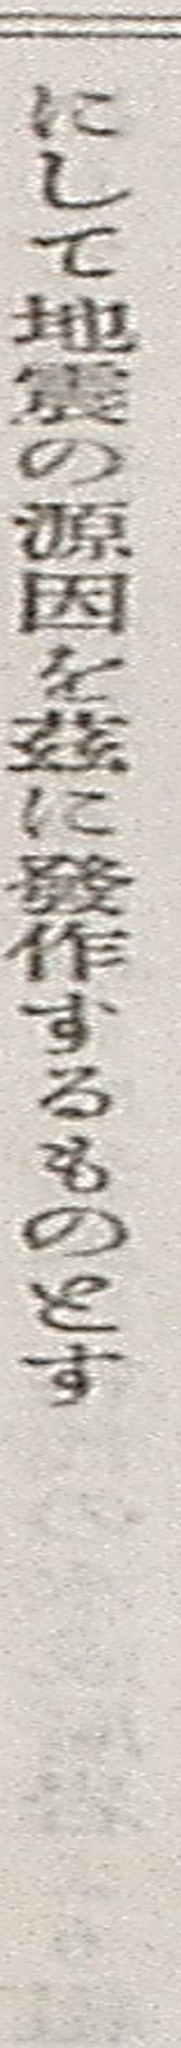にして地震の源因を茲に発作するものとす
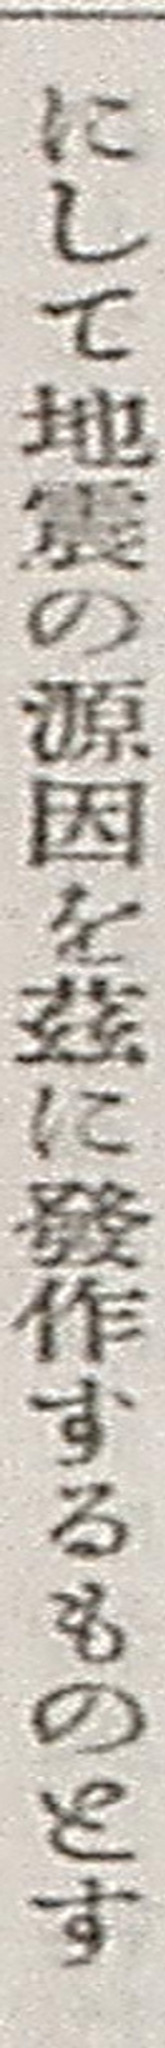にして地震の源因を茲に発作するものとす
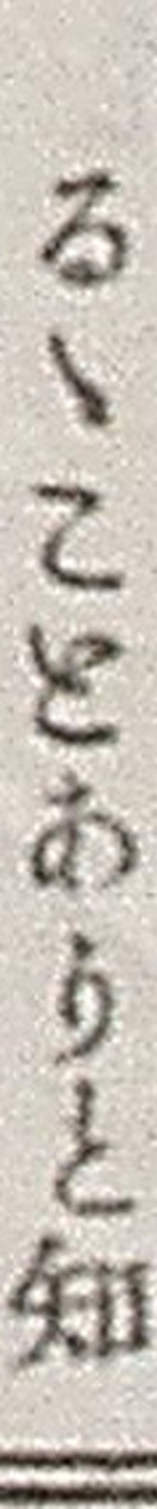るゝことありと知
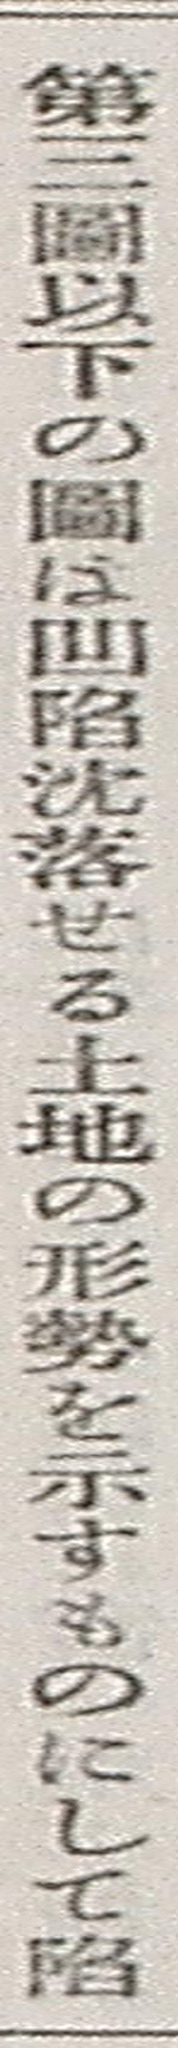第三図以下の図は凹陥沈落せる土地の形勢を示すものにして陥
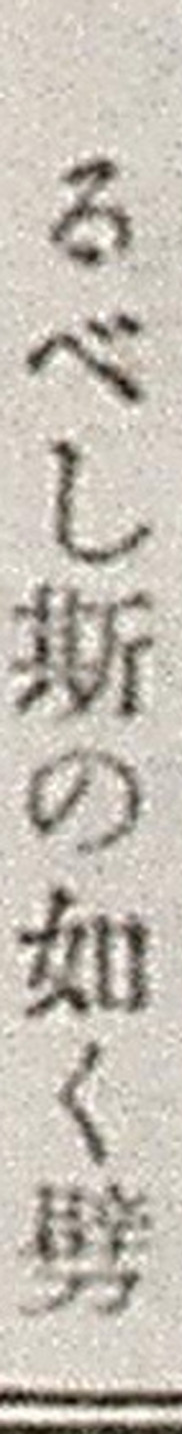るべし斯の如く劈
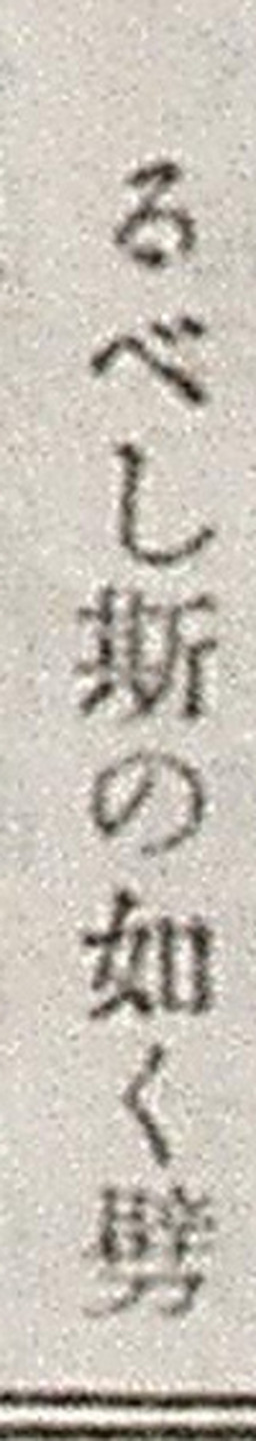るべし斯の如く劈
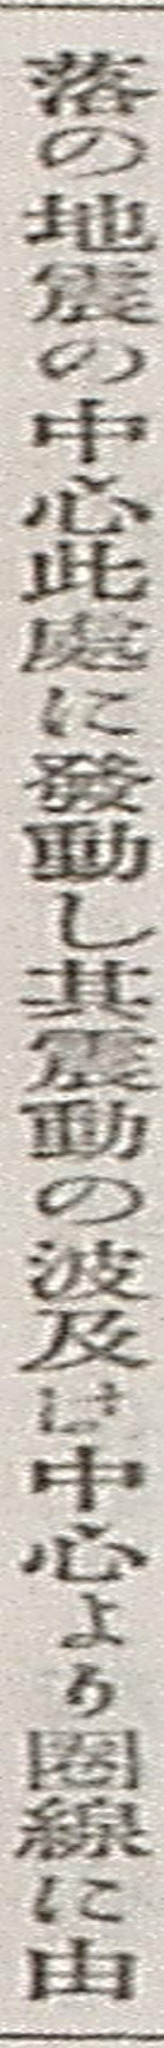落の地震の中心此処に発動し其震動の波及は中心より圏線に由
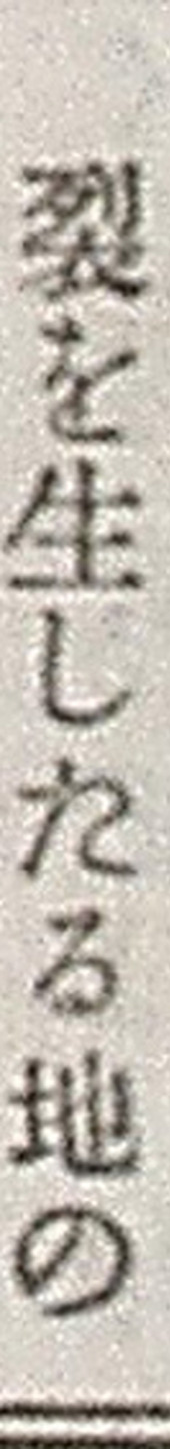裂を生したる他の
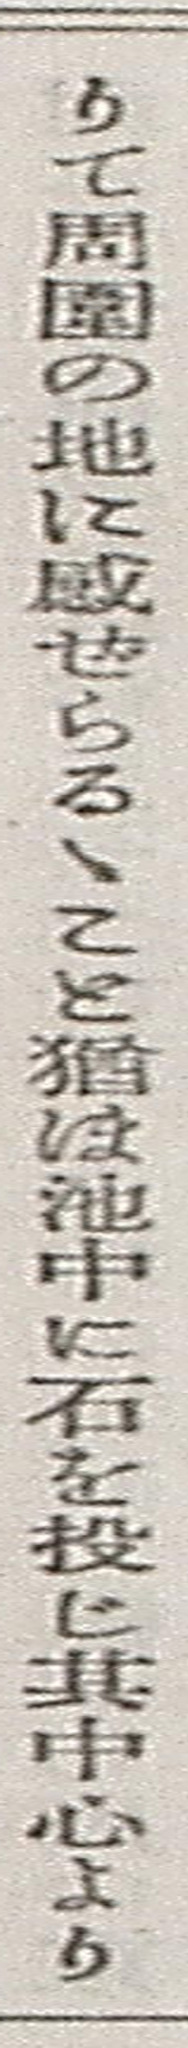りて周囲の地に感ぜらるゝこと猶ほ池中に石を投じ其中心より
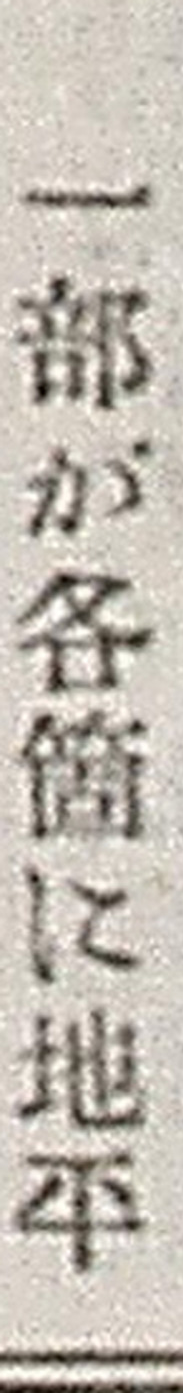一部が各箇に地平
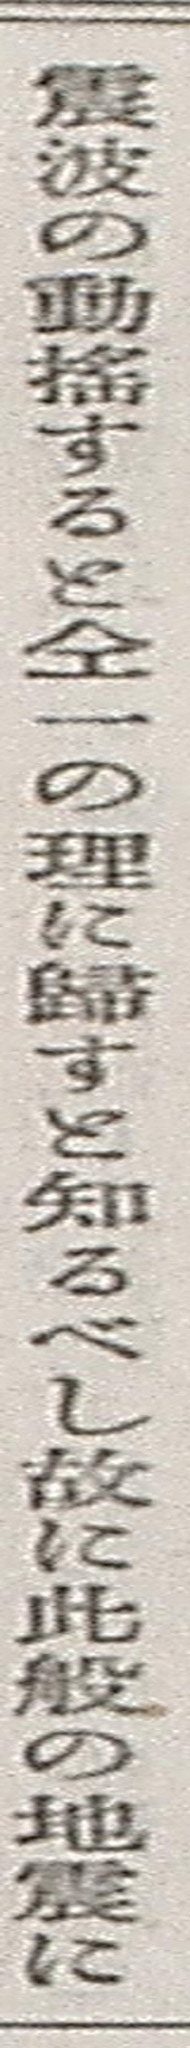震波の動揺すると同一の理に帰すと知るべし故に此般の地震に
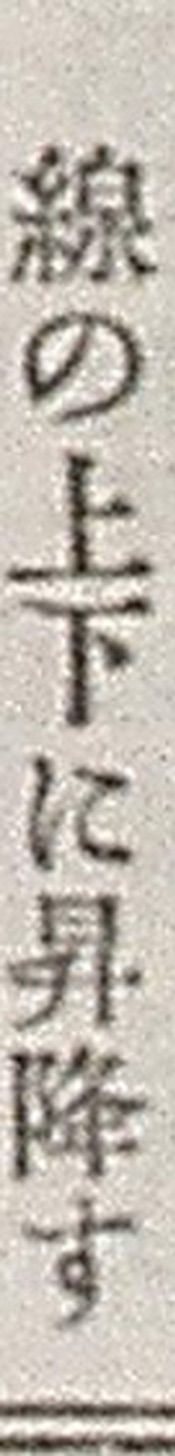線の上下に昇降す
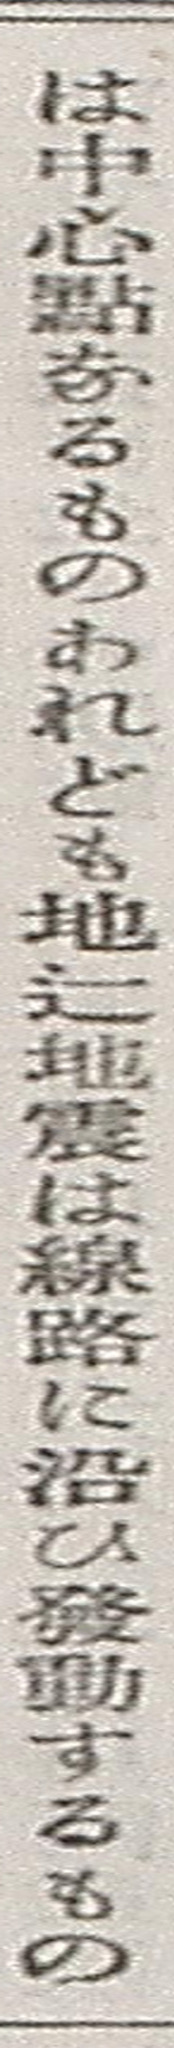は中心点なるものあれども地辷地震は線路に沿ひ発動するもの
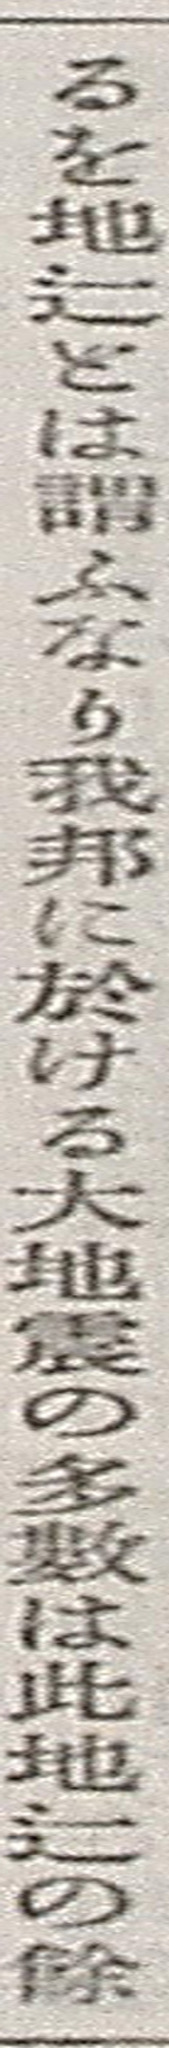るを地辷とは謂ふなり我邦に於ける大地震の多数は此地辷の余
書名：風俗畫報臨時増刊第百二十號　大海嘯被害録（下）
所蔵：東京大学地震研究所図書室 Earthquake Research Institute Library, The University of Tokyo, JAPAN
